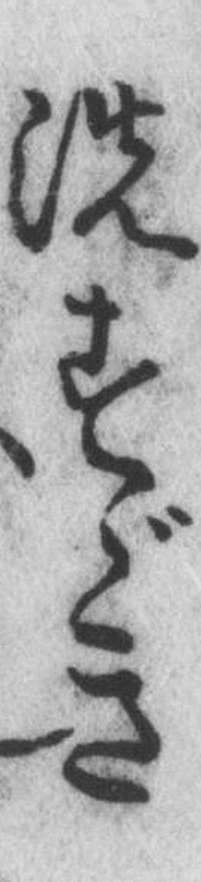洗春ゞき
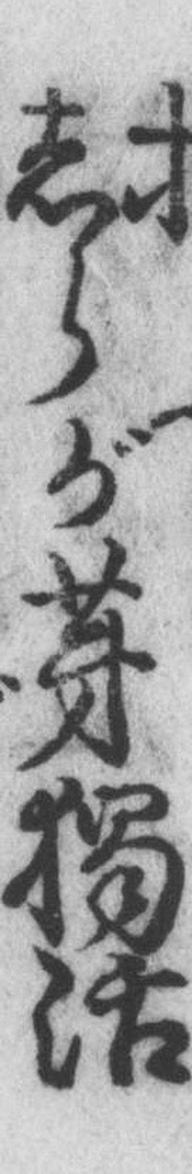志らが芽獨活
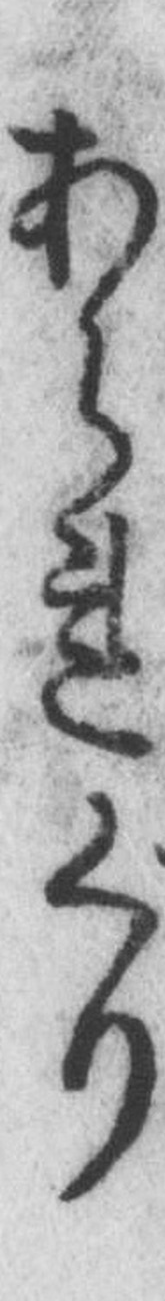あら連ぐり
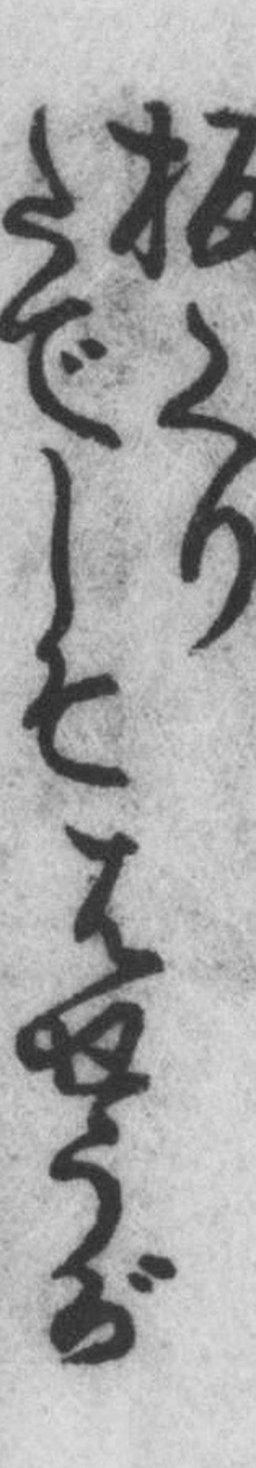たでしそはせうが

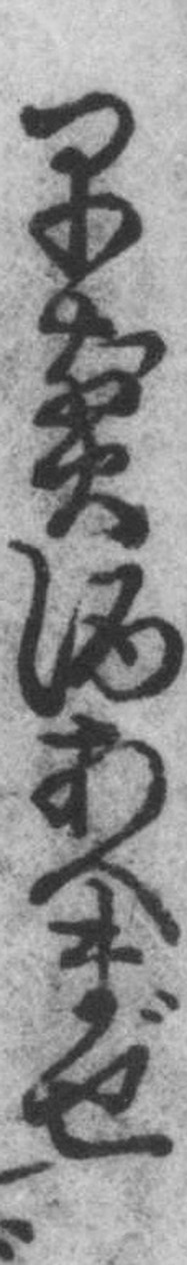早煮酒あへまぜ
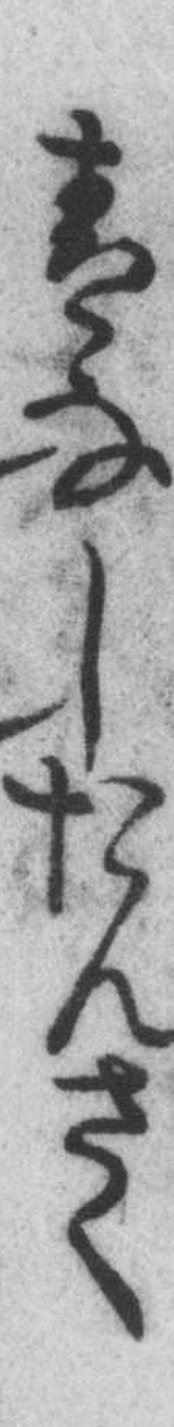青なしたんざく
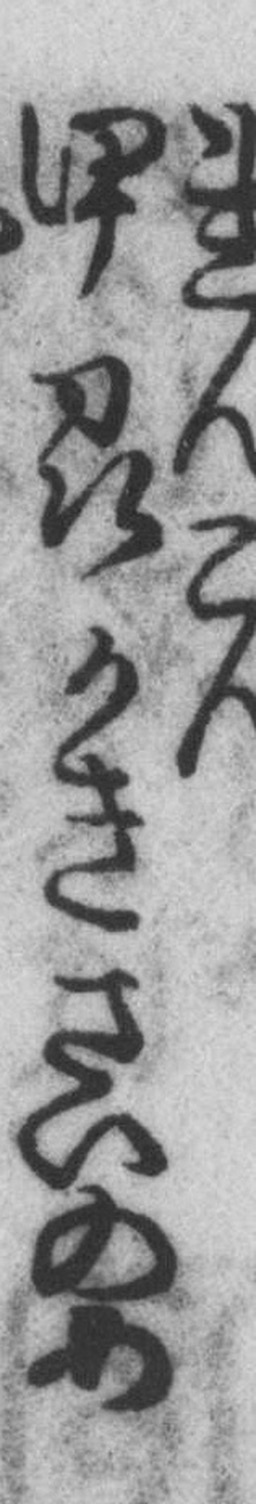甲州かきさいのめ
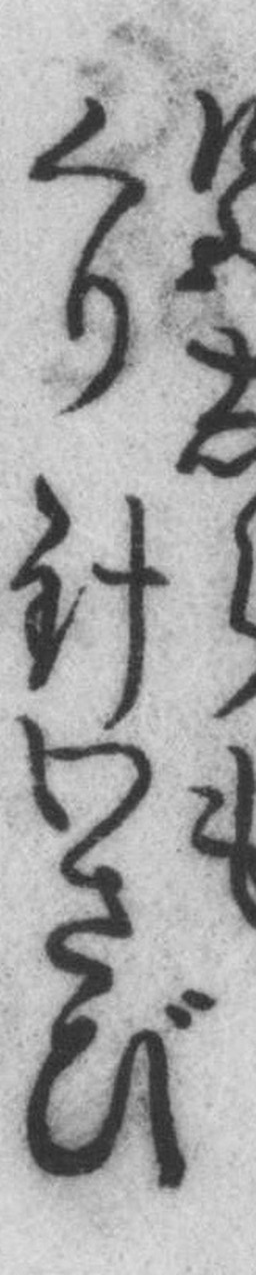くり針わさび
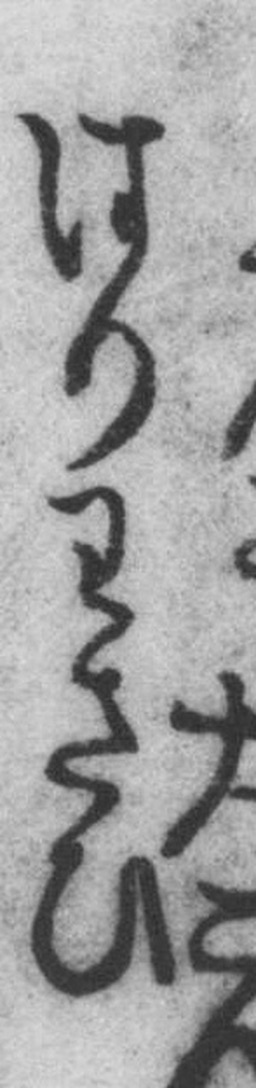はりわさひ
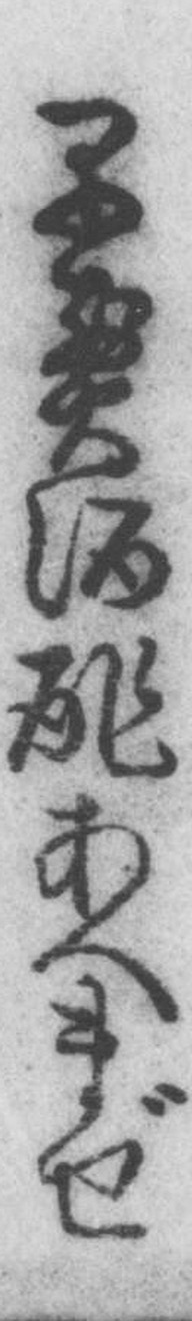早煮酒あへまぜ

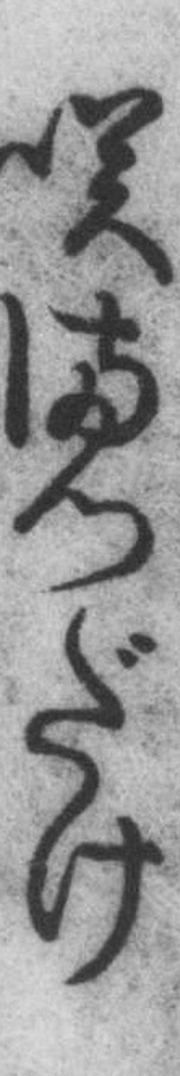咲満つだけ
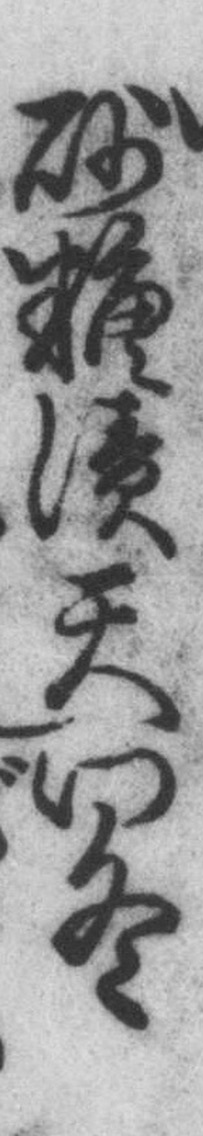砂糖漬天つ冬
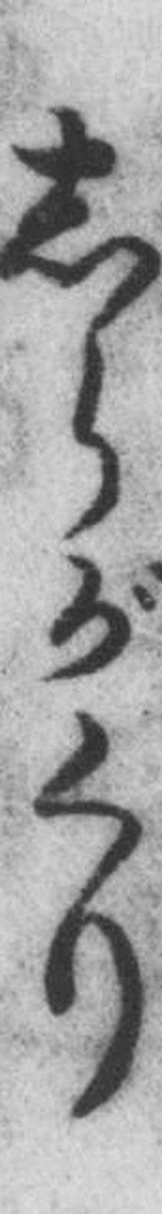志らがくり
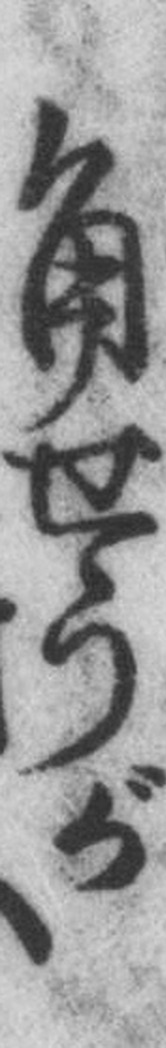角せうが
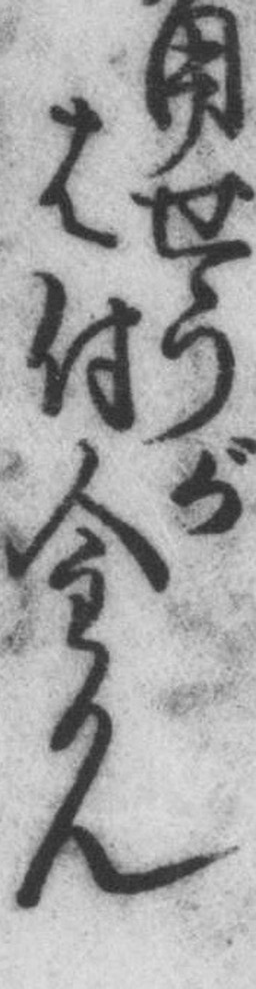は付金かん
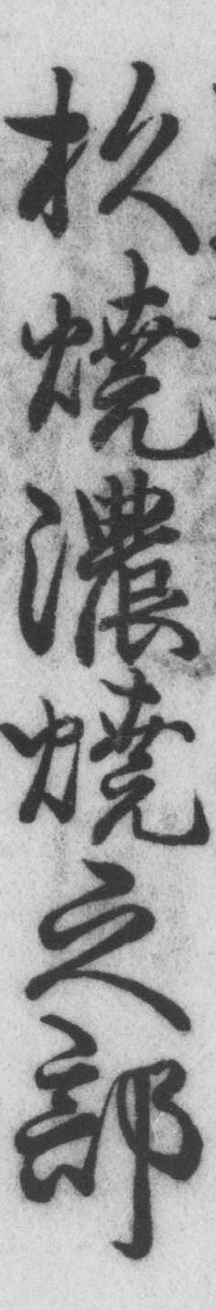杦焼濃焼之部
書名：料理伊呂波庖丁
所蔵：大阪府立大学学術情報センター 国文学研究資料館
